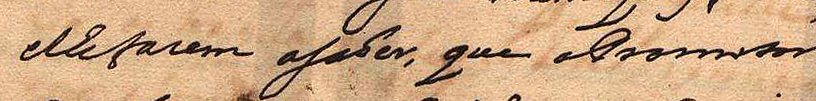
e lhe fazem a saber, que o Promotor
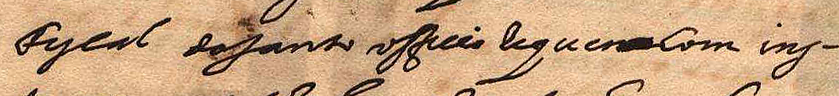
Fiscal do santo officio Requer com ins
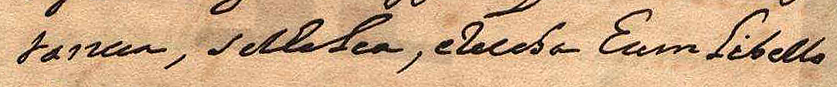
tancia, se lhe Lea, e Receba hum Libello
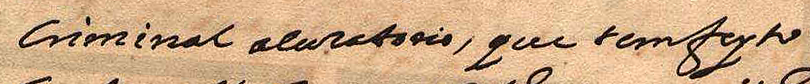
criminal acuzatorio, que tem feyto
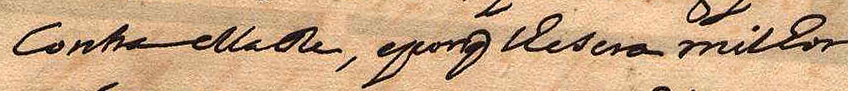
Contra ella Re, e porq̄ lhe sera milhor
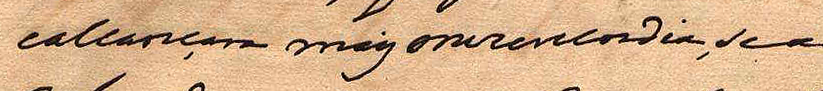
e alcançara mais mizericordia, se a
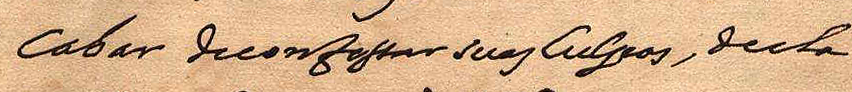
cabar de confessar suas Culpas, decla
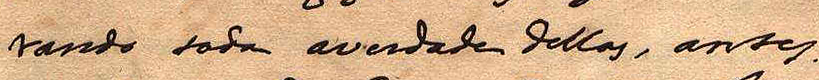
rando toda a verdade dellas, antes
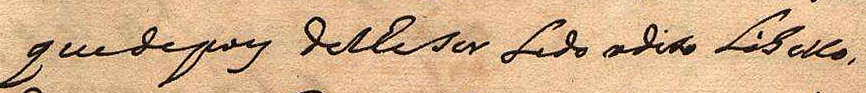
que depois de lhe ser Lido o dito Libello,
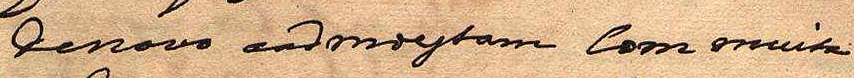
de novo a admoestam com muita
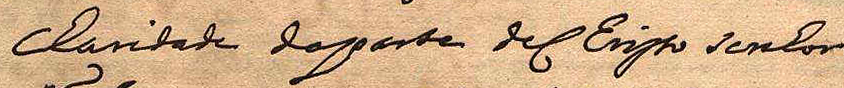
charidade da parte de Christo senhor
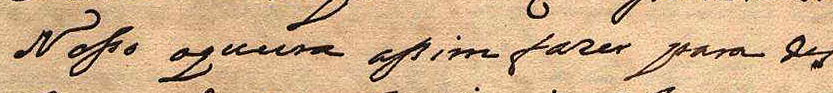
Nosso o queira assim fazer para des
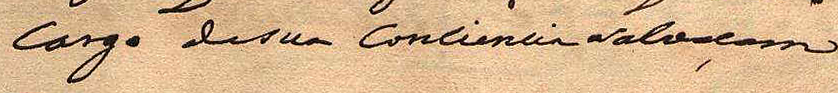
Cargo de sua conciencia salvaçam
